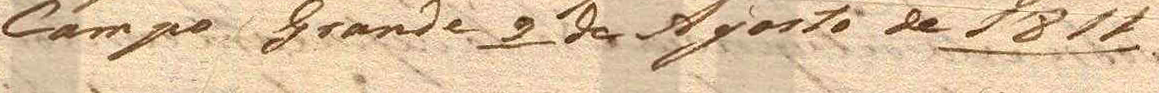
Campo Grande 9 de Agosto de 1811
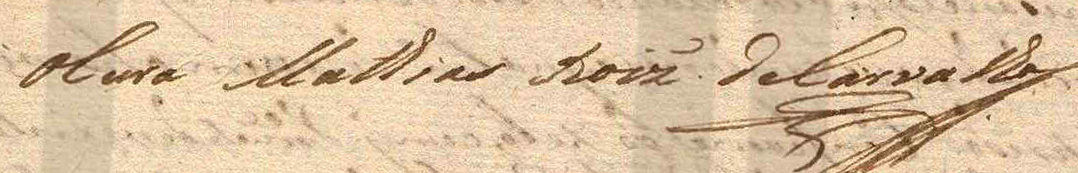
o Cura Mathias Roiz̄ de Carvalho
